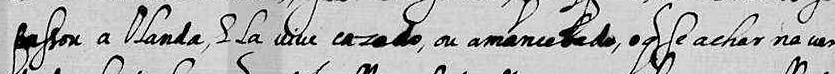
passou a Olanda, E la uiue cazado, ou amancebado, o q̄ se achar na uer
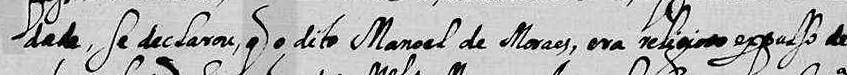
dade, se declarou, q̄ o dito Manoel de Moraes, era religiozo expulso de
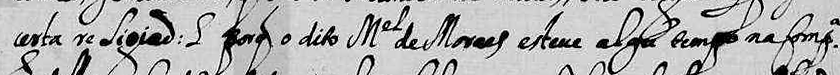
certa religiaõ: E porq̄ o dito Mel de Moraes esteue algū tempo na Comp.a
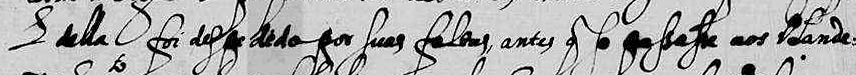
E della foi despedido por suas faltas, antes q̄ se passasse aos OLande
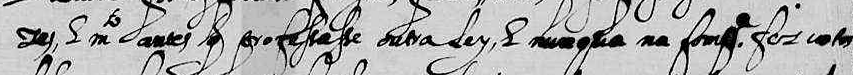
zes, E mto antes q̄ professasse outra Ley, E nunqua na Comp.a fez uotos
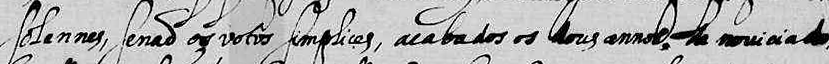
Solennes, senaõ os votos simplices, acabados os dous annos de nouiciado
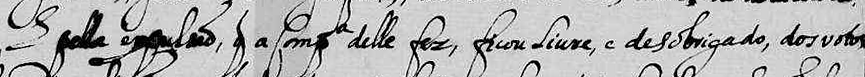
E pella expulsaõ, q̄ a Compa delle fez, ficou liure, e desobrigado, dos votos
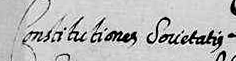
Constitutiones Societatis
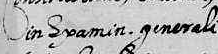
in Examin generali
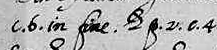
c. 6. in fine. E p. v. c. 4.
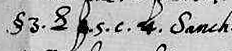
§3. E p. 5 c. 14. Sanch.
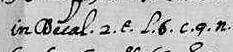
in Decal. 2. t. L. 6. c. 9. n.
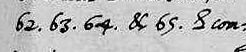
62. 63. 64. & 65. E com
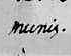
munis.
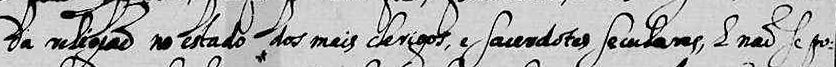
da religiaõ no estado dos mais clerigos, e Sacerdotes Seculares, E naõ se po
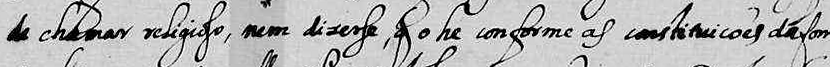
de chamar religioso, nem dizerse, q̄ o he conforme as constituiçoẽs da Com
